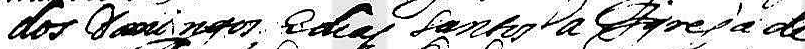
dos domingos, e dias santos a Igreja de
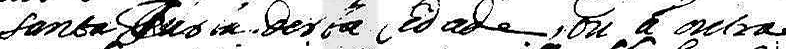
Santa Iusta desta Cidade, ou a outra
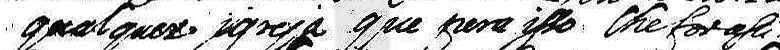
qualquer igreja que pera isso lhe for asina
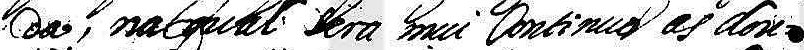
da, na qual sera mui continuo as dou
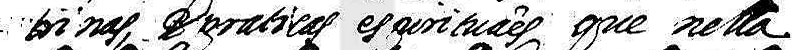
trinas e praticas espirituaes que nella
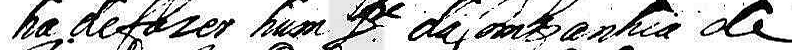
ha de fazer hum p.e da Companhia de
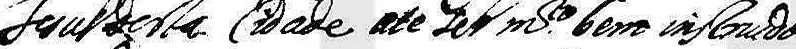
Jesus desta Cidade ate ser m.to bem instruido
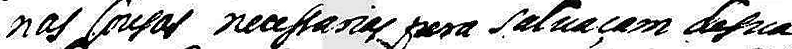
nas Couzas necessarias pera saluaçam de sua
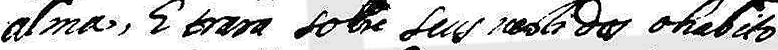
alma, E trara sobre seus uestidos o habito
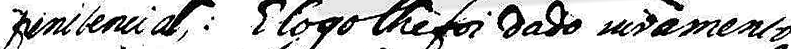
pinitencial, E logo lhe foi dado iuramento
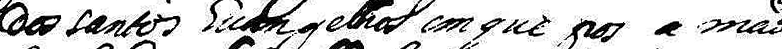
dos santos Evangelhos em que pos a maõ
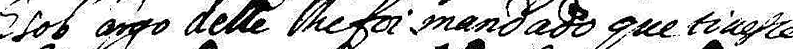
E sob argo delle lhe foi mandado que tiuesse
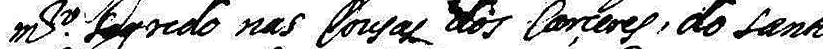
m.to segredo nas Cousas dos Carçeres, do santo
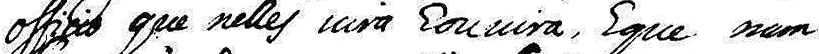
officio que nelles uira e ouuira, e que nam
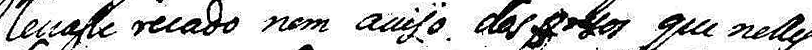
levasse recado nem auiso dos presos que nelles
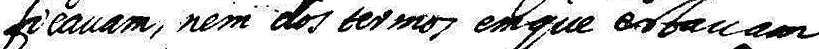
ficauam, nem dos termos em que estauam
